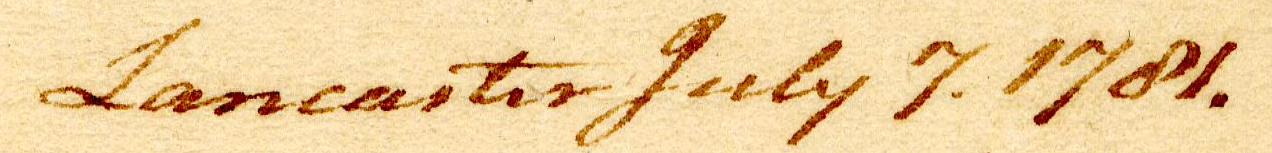Lancaster July 7. 1781.
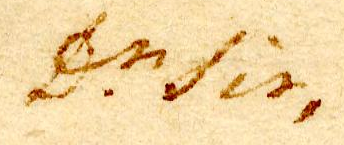D^r. Sir,
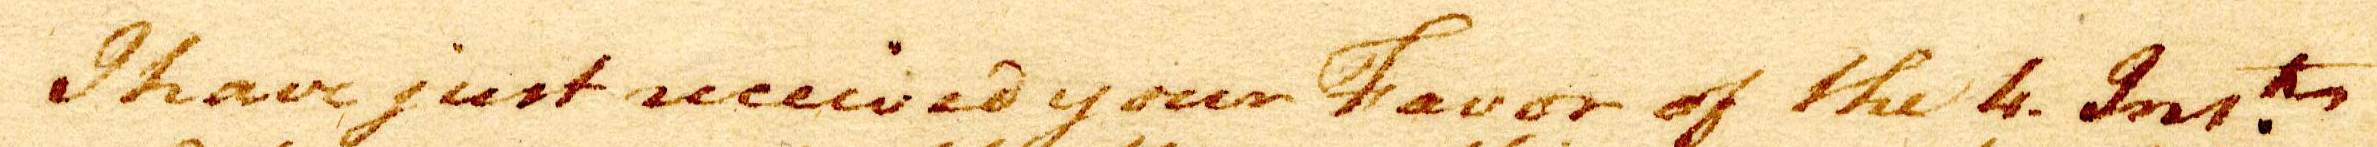I have just received your Favor of the 4. Ins^t.
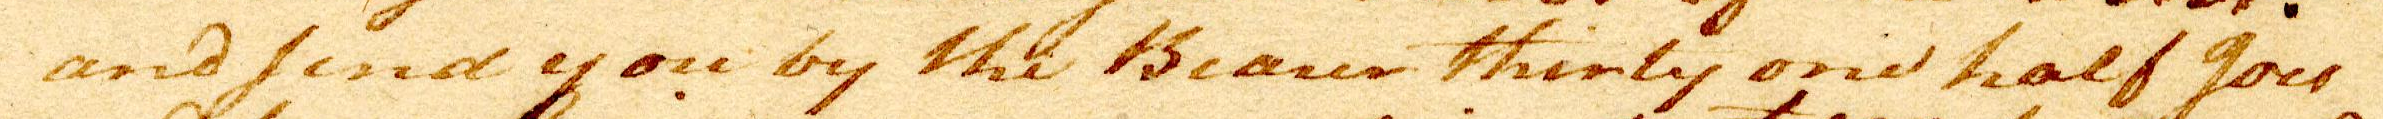and find you by the Bearer thirty one half Joes
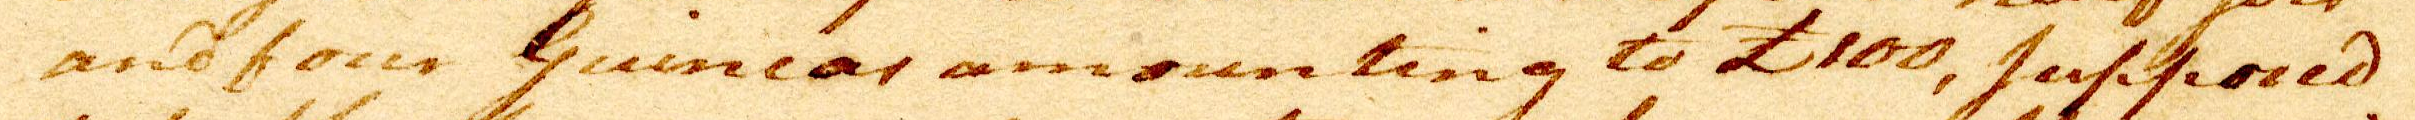and four Guineas amounting to £100, supposed
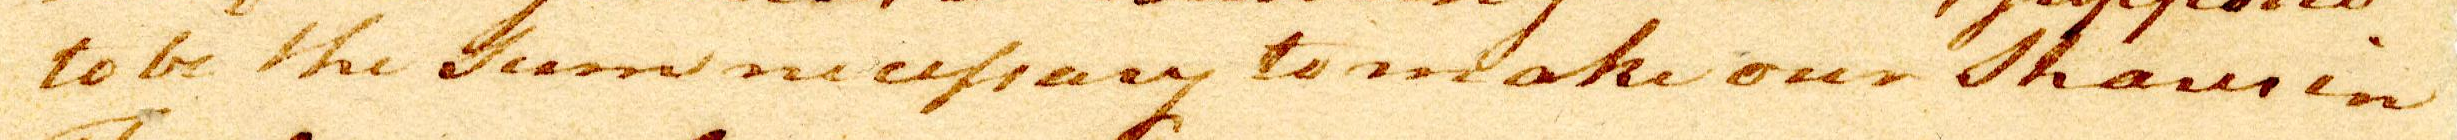to be the sum necessary to make our shares in
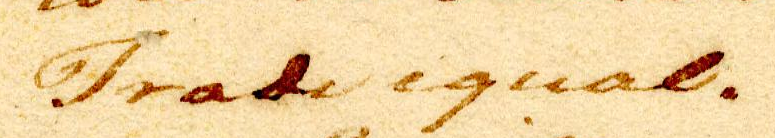Trade equal.
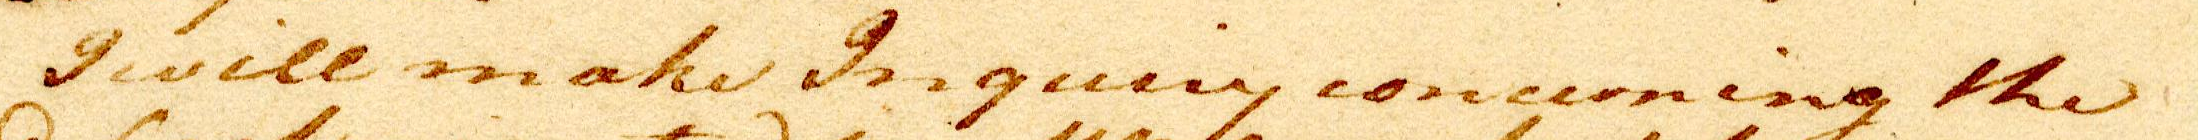I will make Inquiry concerning the
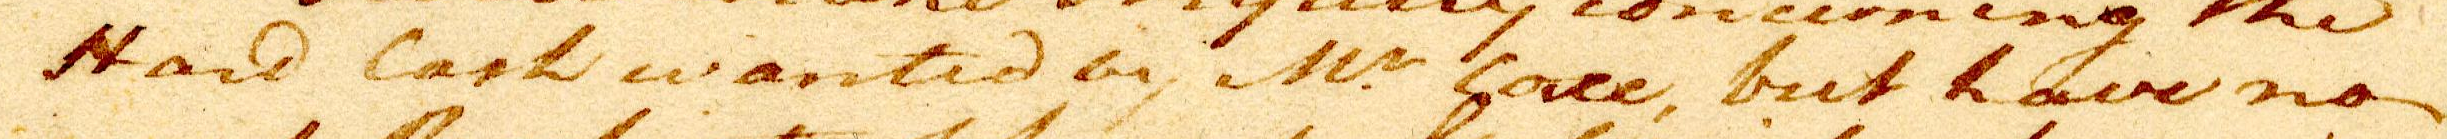Hard Cash wanted by M^r. Coxe, but have no
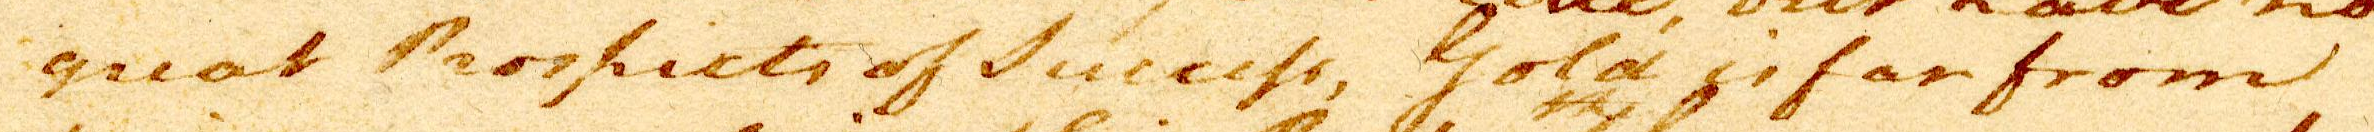great Prospects of Success, Gold is far from
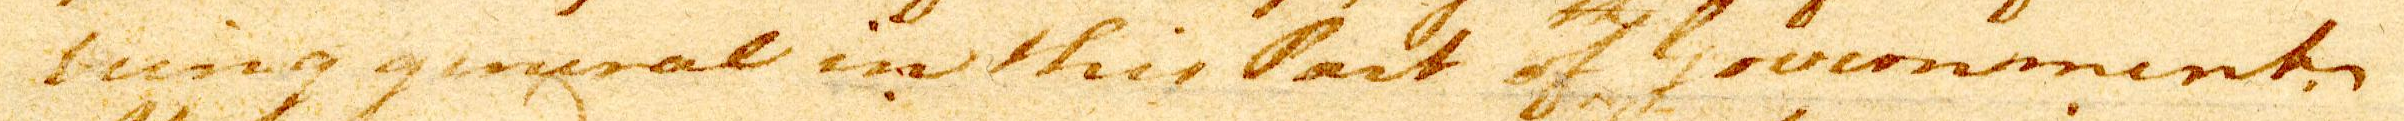being general in this Part of Government
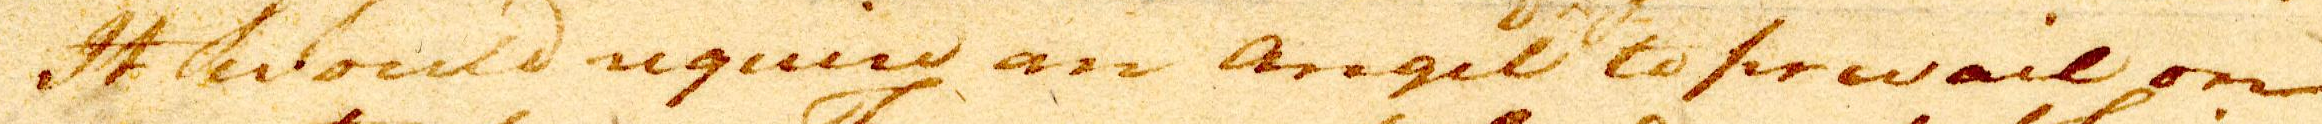It would require an Angel to prevail on
